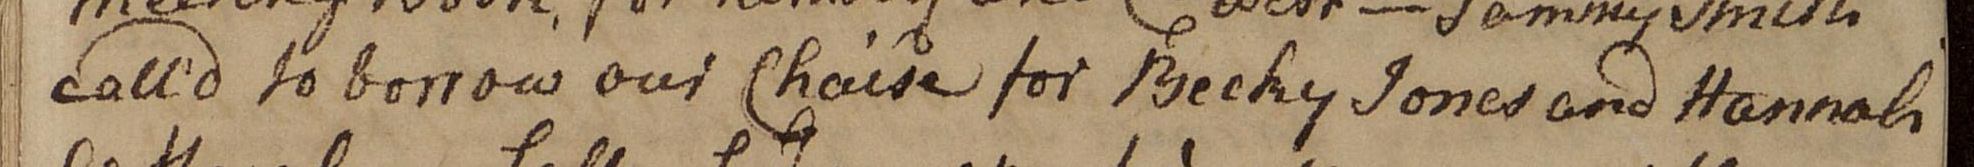call'd to borrow our Chaise for Becky Jones and Hannah
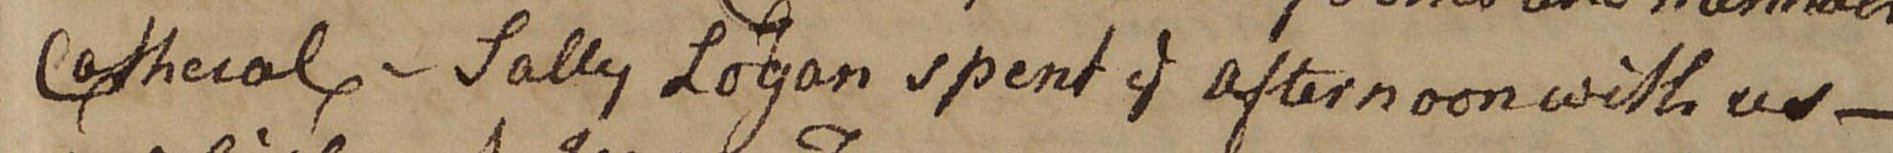Catheral- Sally Logan spent y^e afternoon with us-
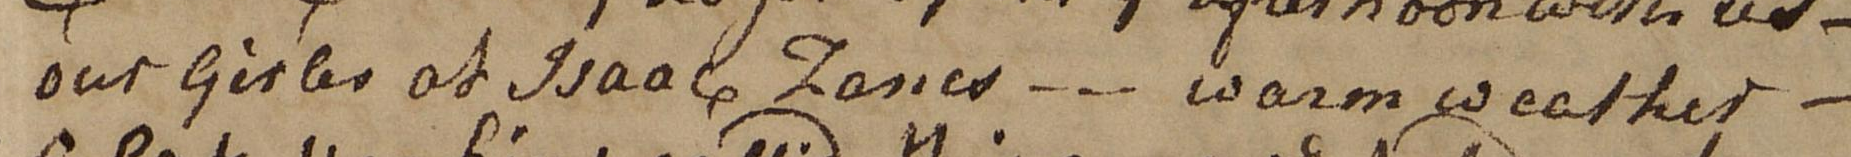our Girles at Isaac Zanes-- warm weather-
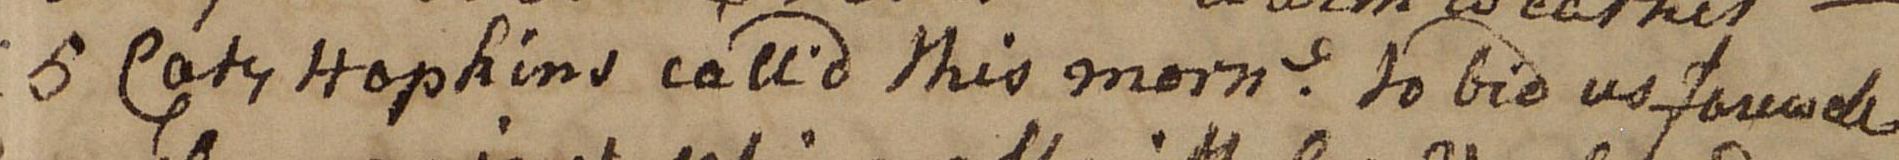5 Caty Hopkins call'd this morn^g. to bid us farewell
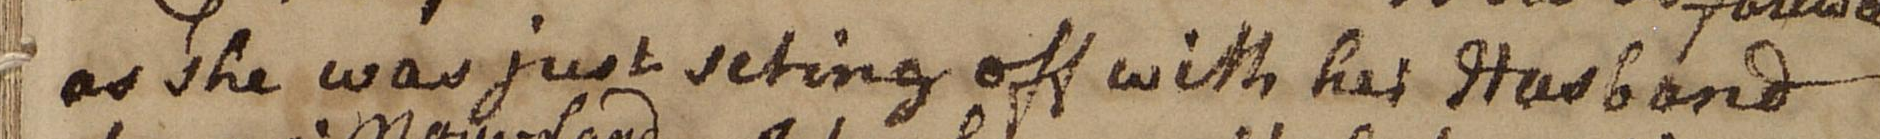as she was just seting off with her Husband
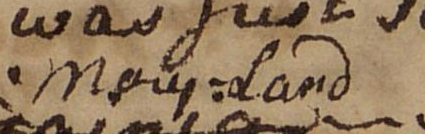Mary:Land
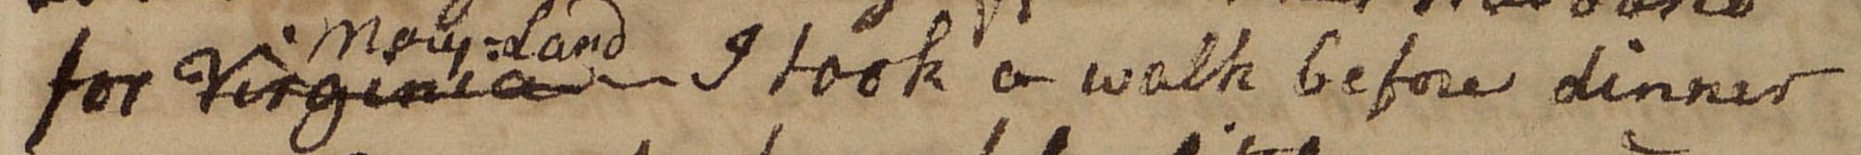for Virginia I took a walk before dinner
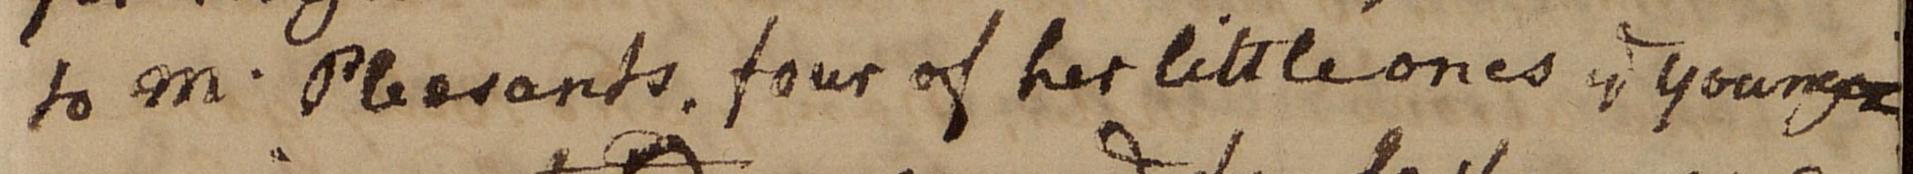to M. Pleasants, four of her little ones y^e younger
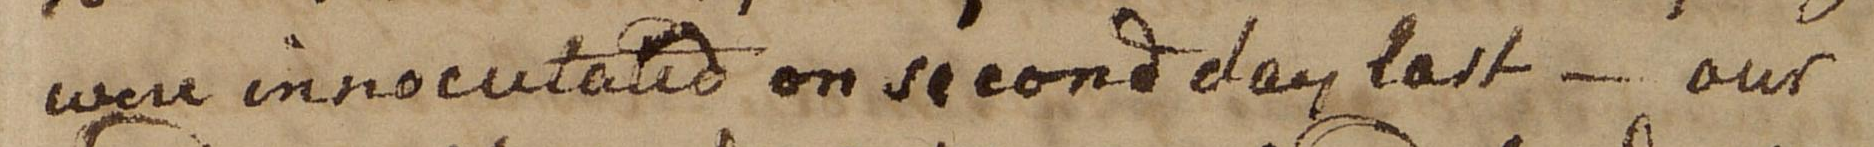were innoculated on second day last- our
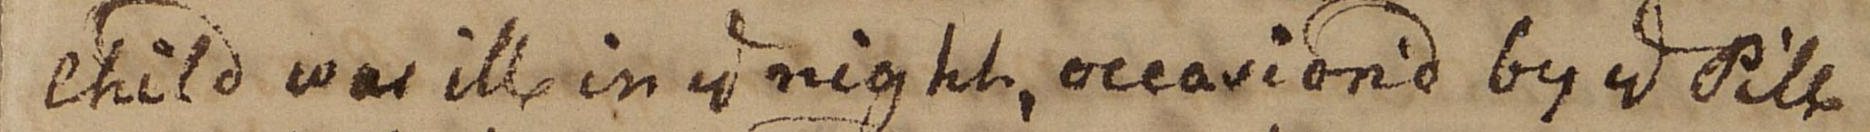Child was ill in y^e night, occasion'd by y^e Pill
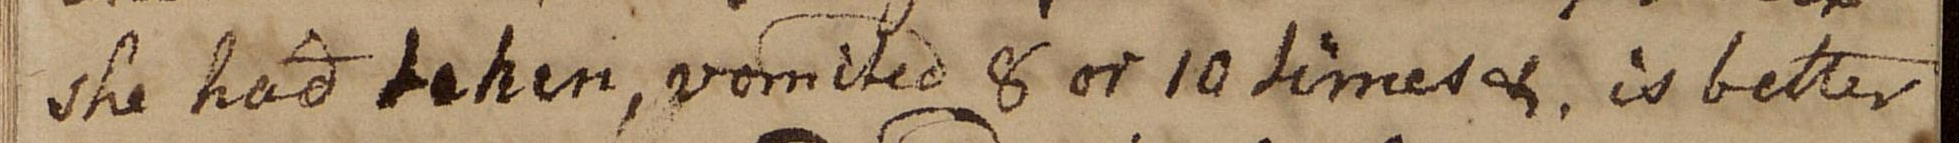she had taken, vomited & or 10 times &, is better
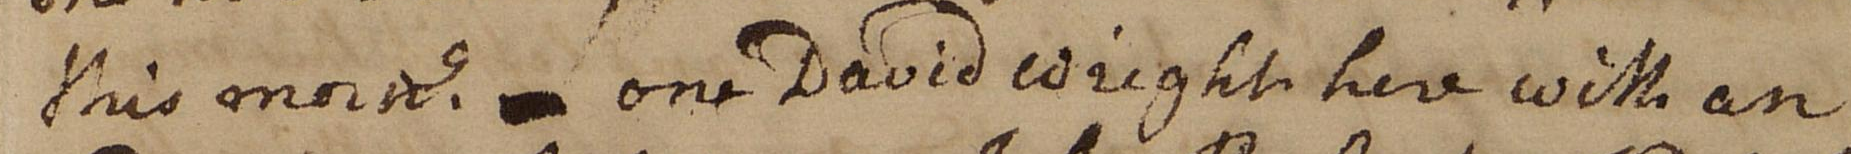this morn^g.- one David Wright here with an
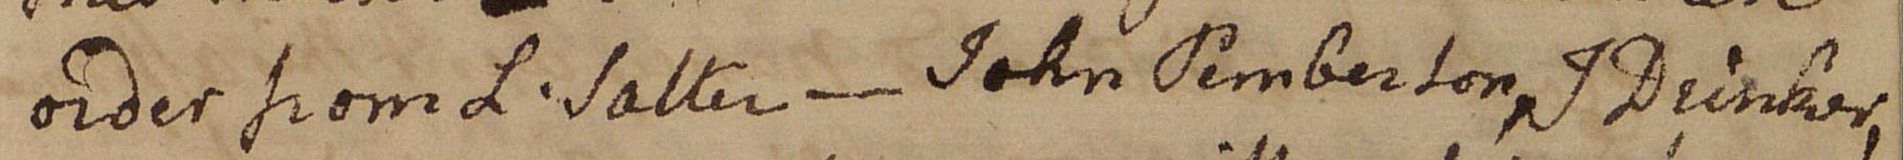order from L. Salter- John Pemberton, I Drinker,
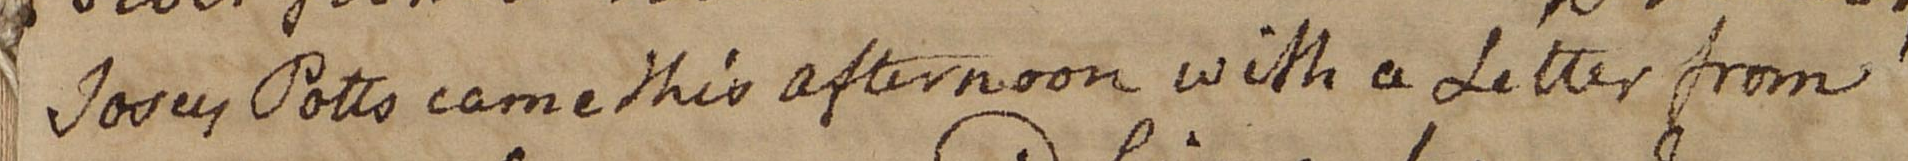Josey Potts came this afternoon with a Letter from
